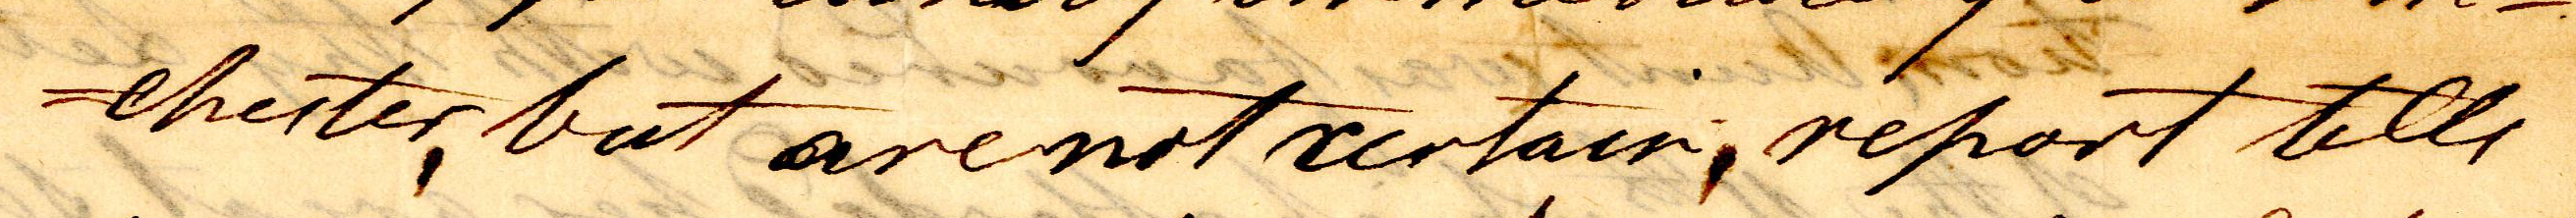-chester, but are not certain, report tells
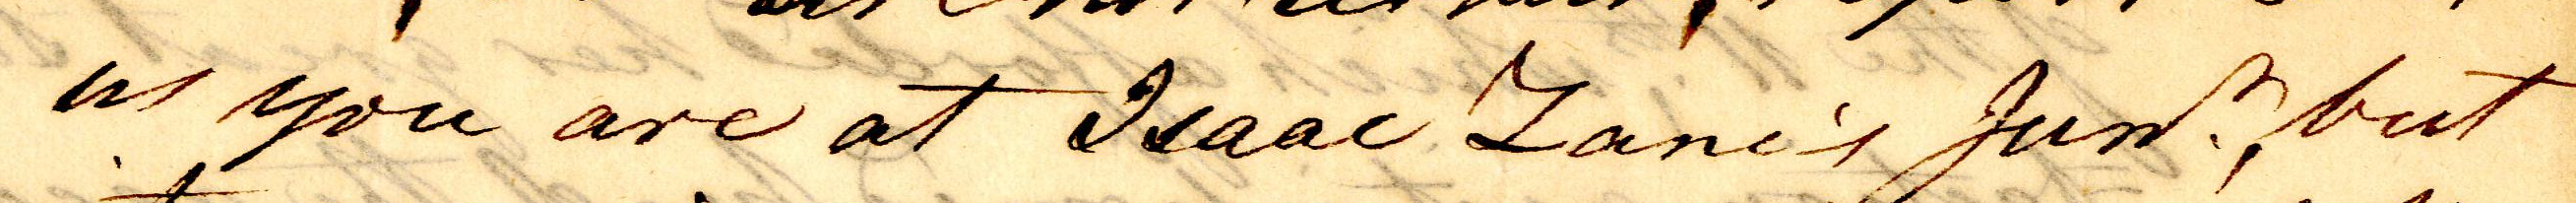us you are at Isaac Zane's Jun^r., but
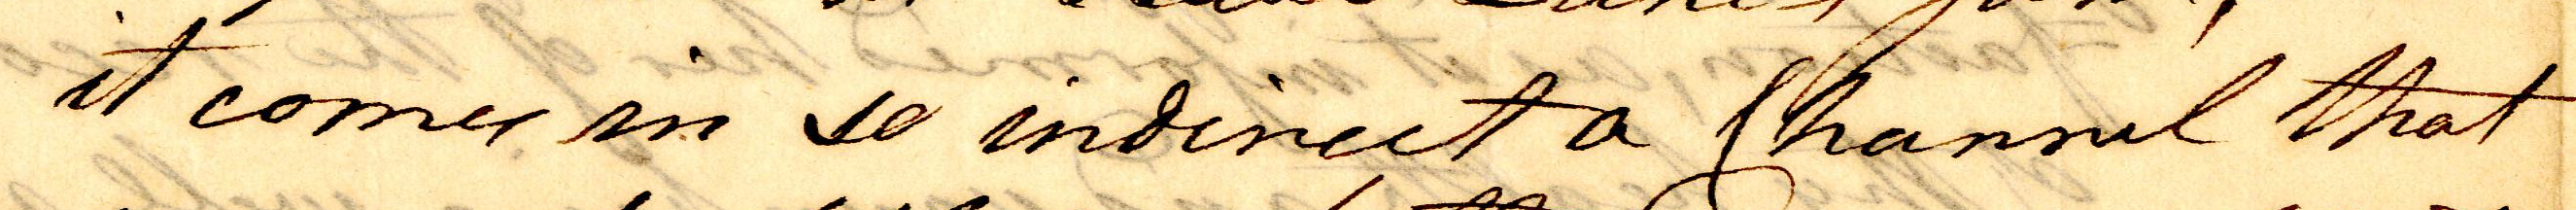it comes in so indirect a Channel that
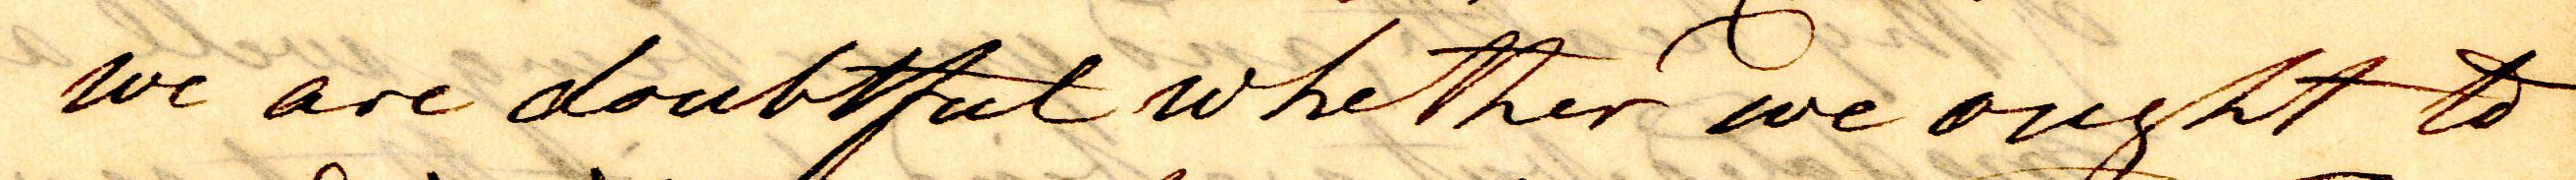we are doubtful whether we ought to
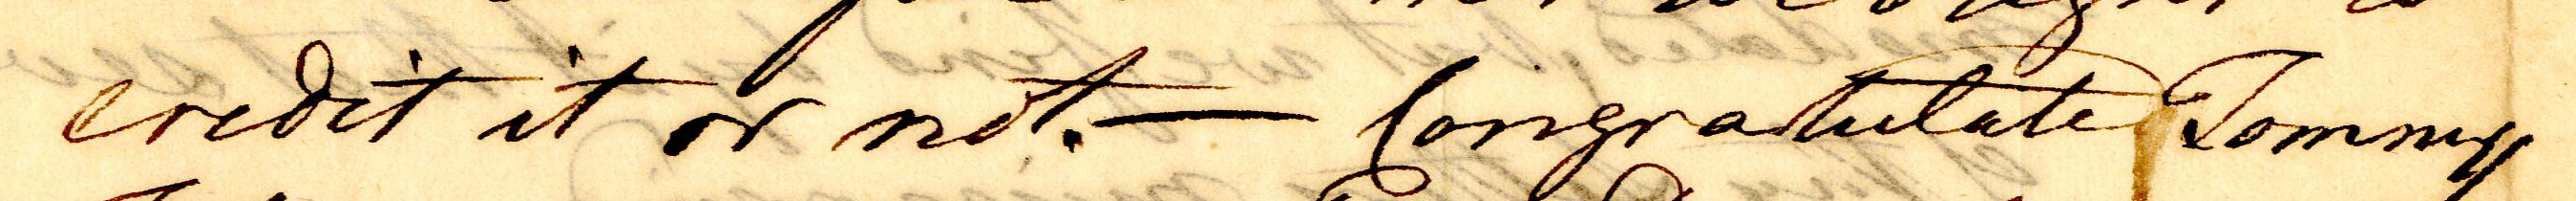credit it or not.- Congratulate Tommy
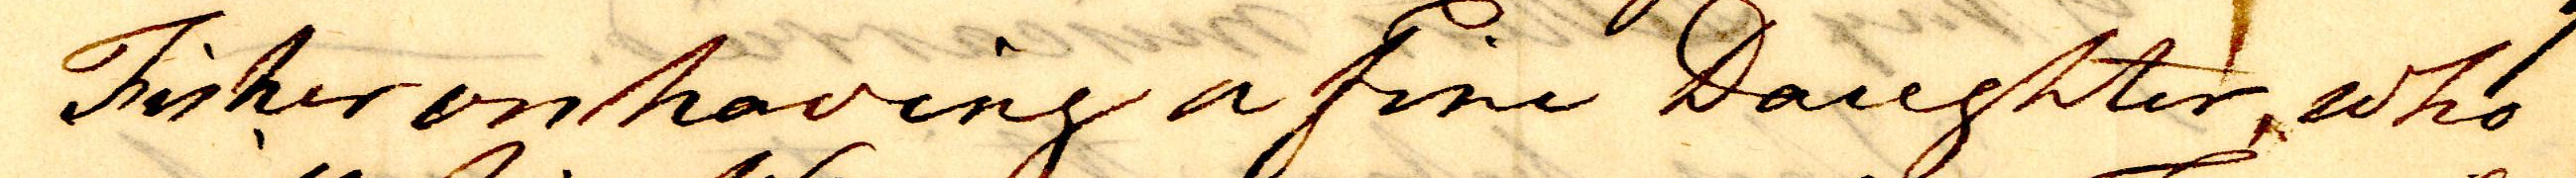Fisher on having a fine Daughter, who
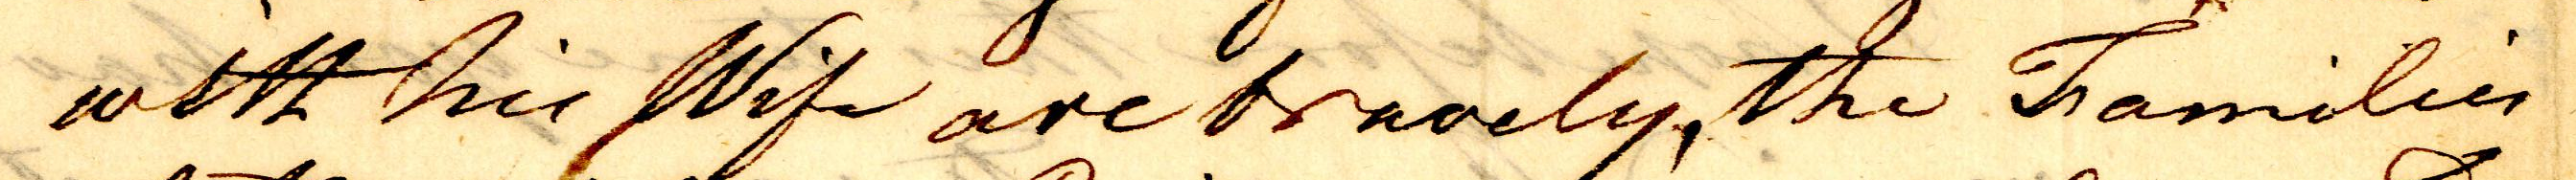with his Wife are bravely, the Families
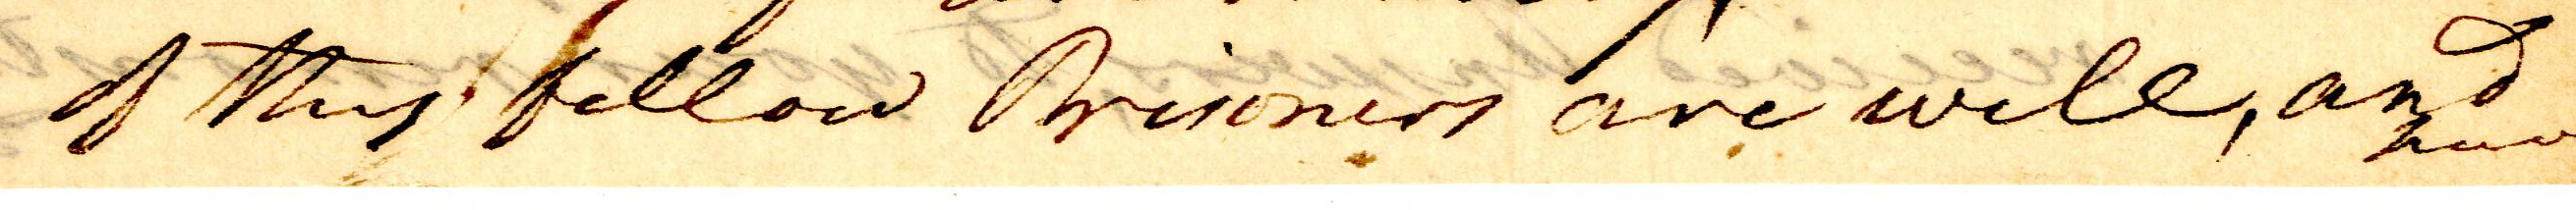of thy fellow Prisoners are well, and
